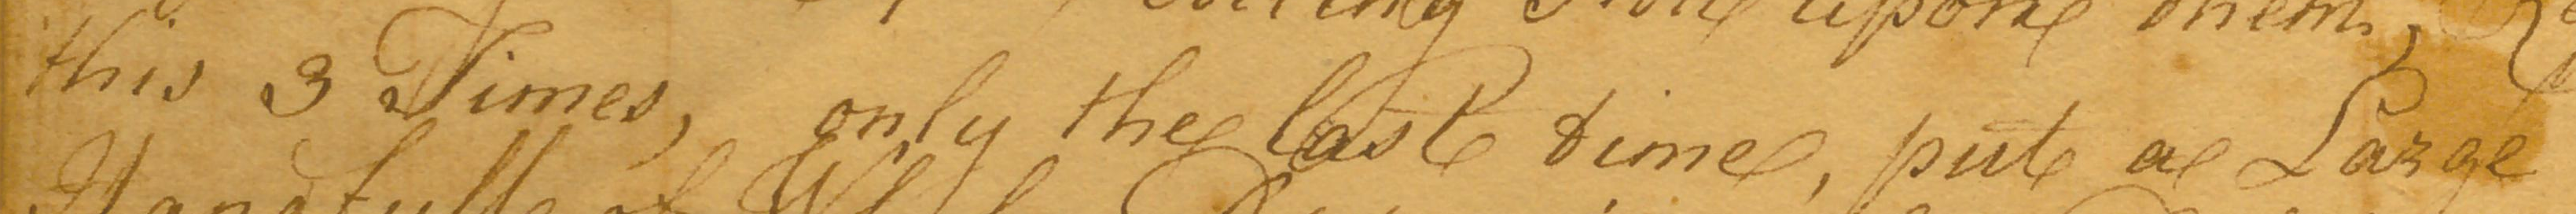this 3 Times, only the last time, put a Large
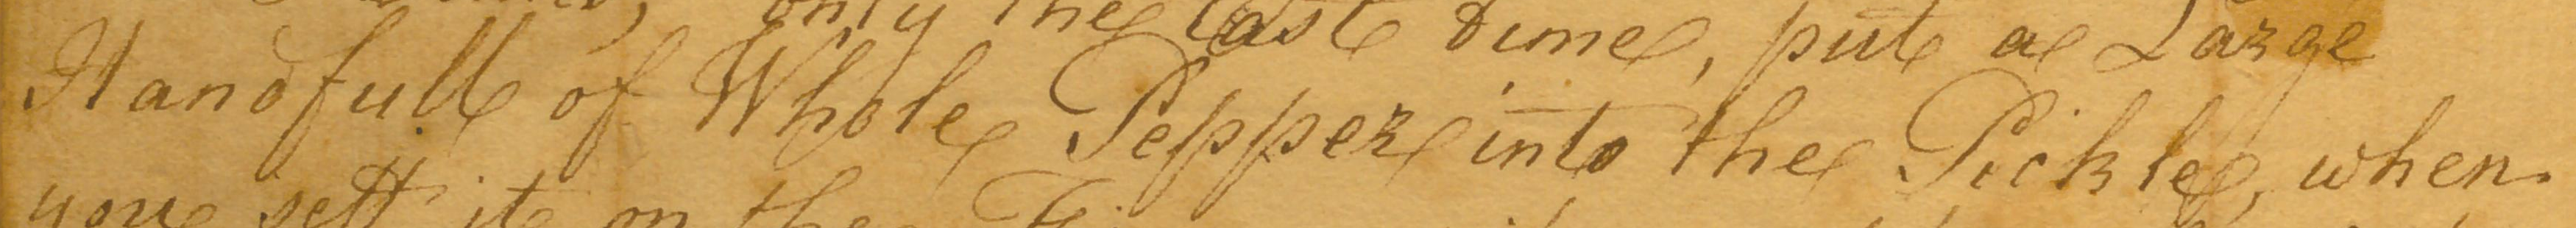Handfull of Whole Pepper into the Pickle, when
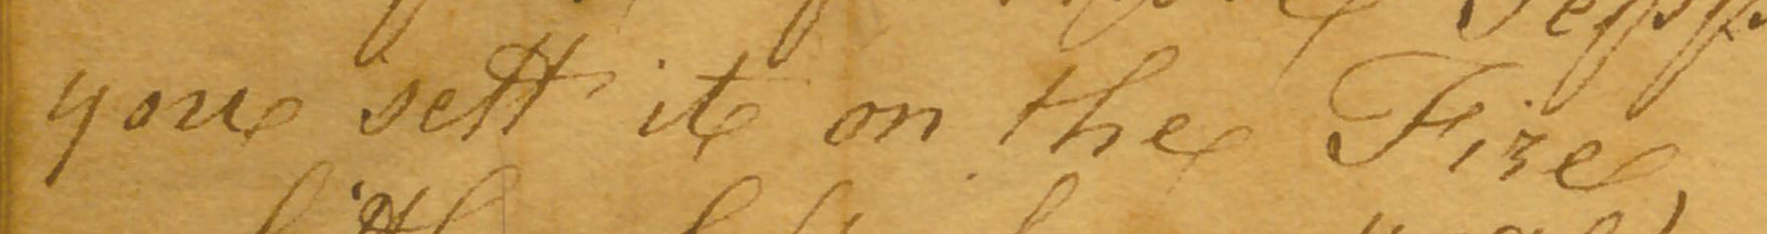you sett it on the Fire
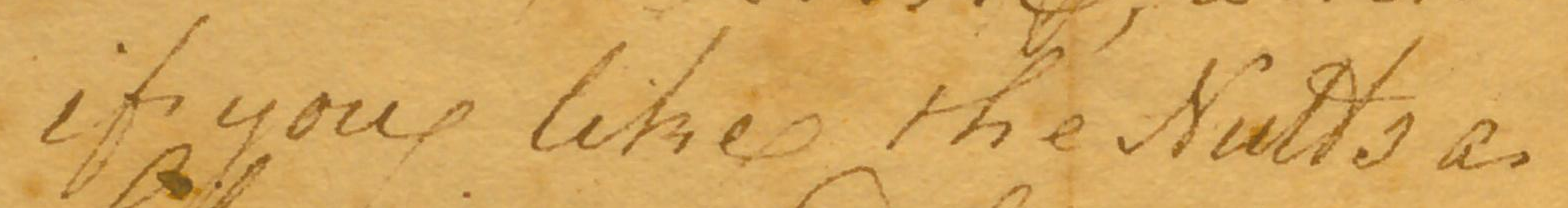if you like the Nutts a
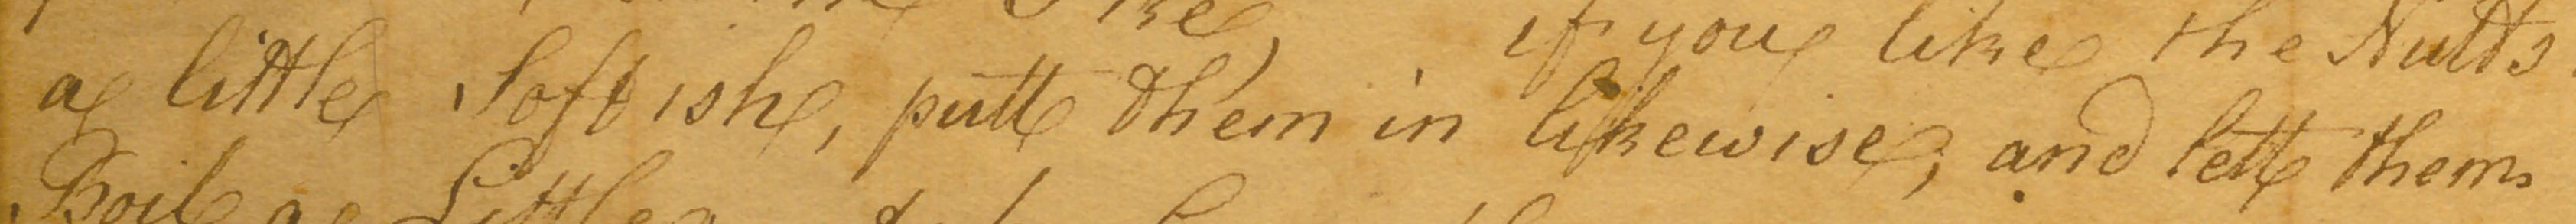a little Softish, putt them in likewise; and lett them
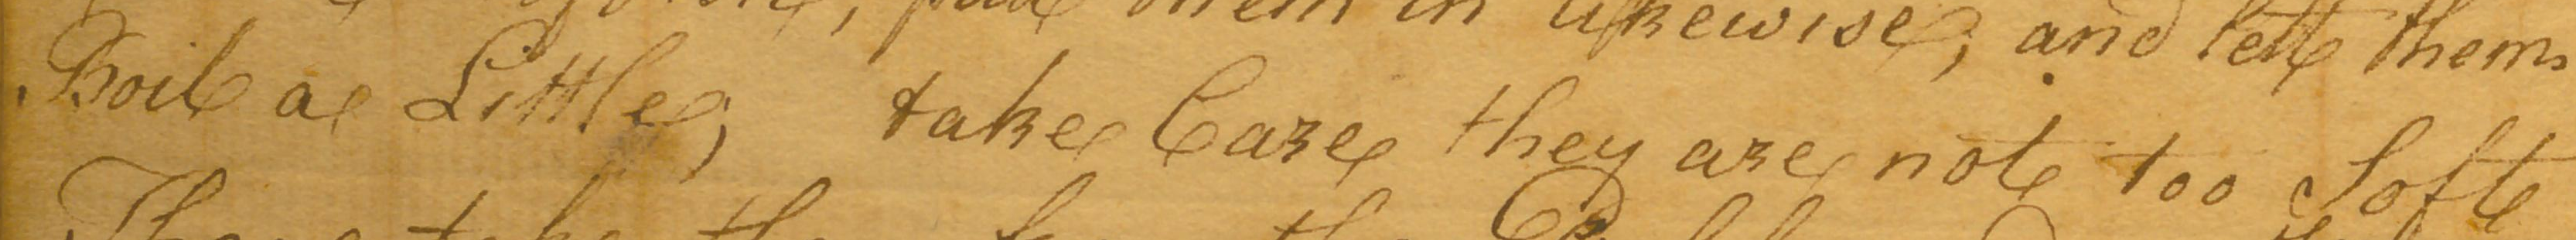Boil a Little, take Care they are not too Soft
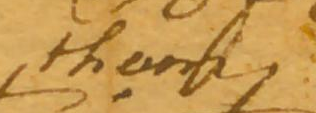them
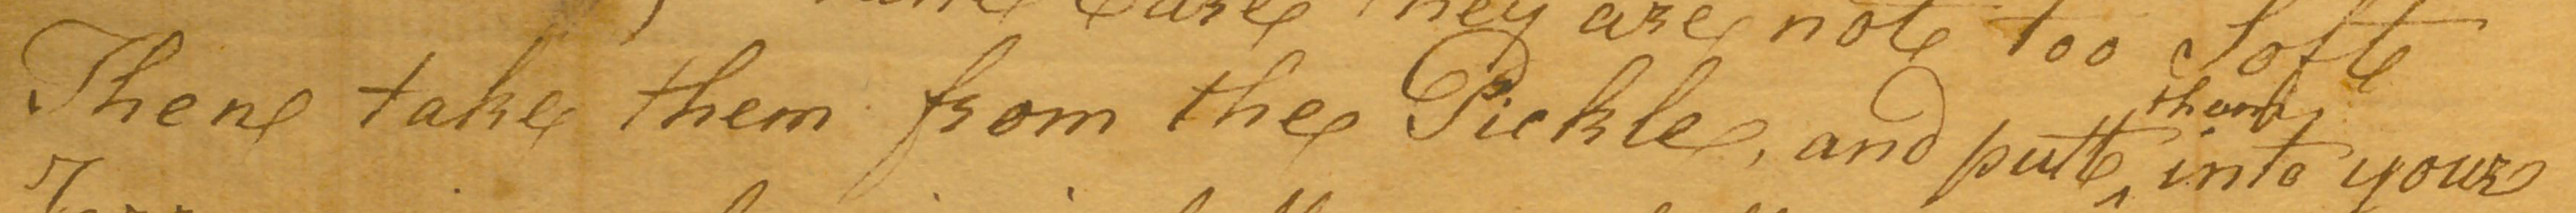Then take them from the Pickle, and putt ^ into your
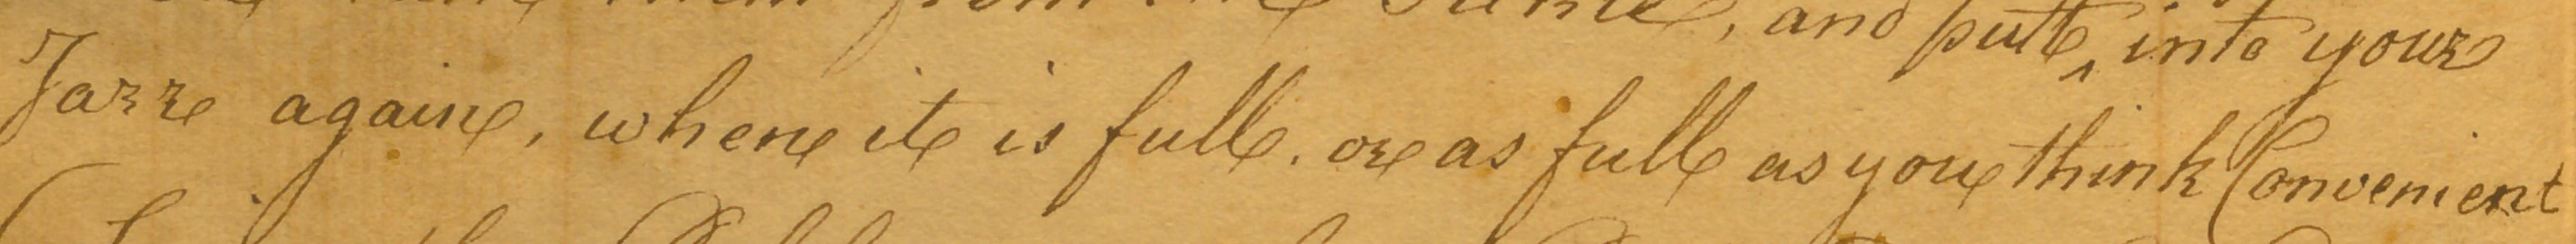Jarr again, when it is full, or as full as you think Convenient
